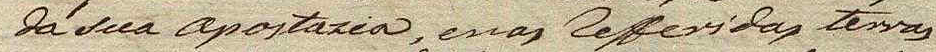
da sua apostazia, e nas Refferidas terras
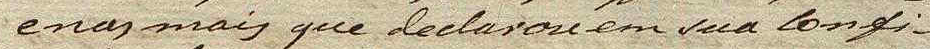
e nas mais que declarou em sua confi
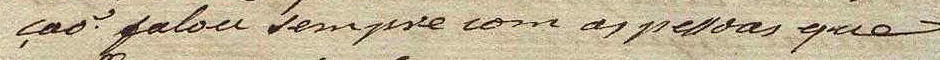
çaõ falou sempre com as pessoas que
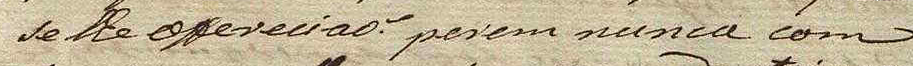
se lhe offereciaõ porem nunca com
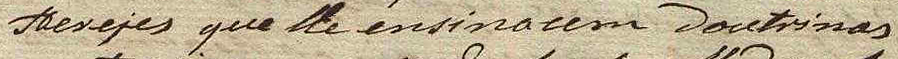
Herejes que lhe ensinacem doutrinas
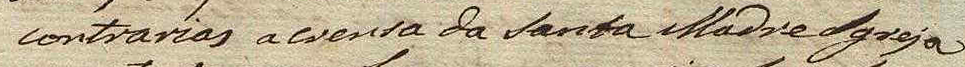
contrarias a crensa da santa Madre Igreja
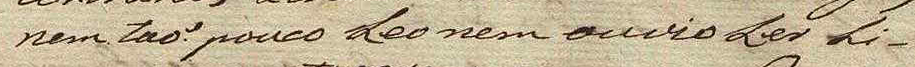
nem taõ pouco deo nem ouvio Ler Li
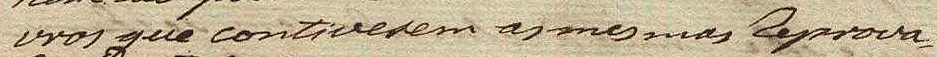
vros que contivesem as mesmas Reprova
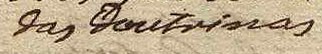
das doutrinas
